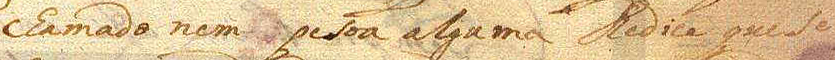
chamado nem pesoa alguma lhe dice que se
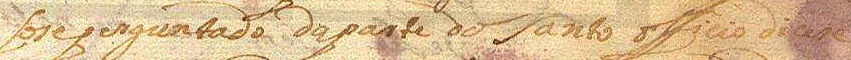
fose perguntado da parte do Santo officio dicese
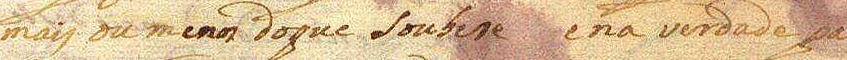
mais ou menos do que soubese e na verdade pa
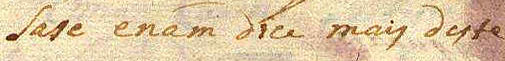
sase e nam dice mais deste
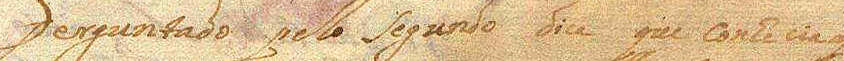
Perguntado pelo Segundo dice que conhecia as
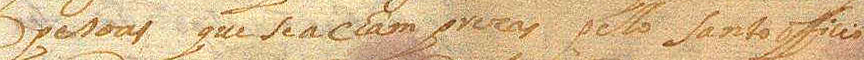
pessoas que se acham prezas pello Santo officio
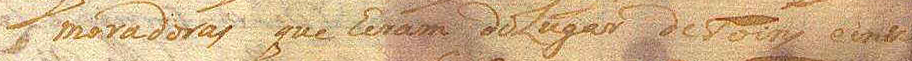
moradoras que heram do Lugar de Toins e entr
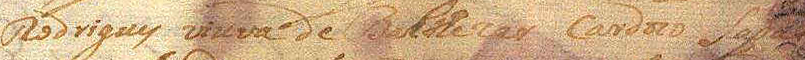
Rodrigues viuva de Balthezar Cardozo Sapa_
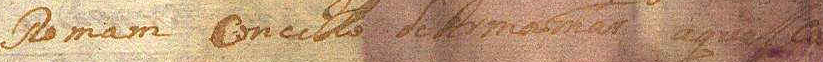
Romam Concelho de Armamar a qual _
